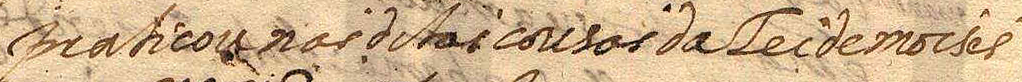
praticou nas ditas cousas da Lei de moises
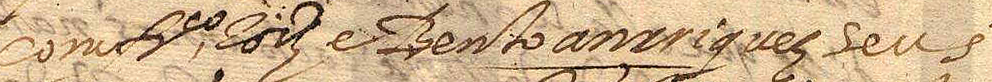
com frco. Roiz̄ e Bento anrriquez seus
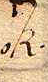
o R
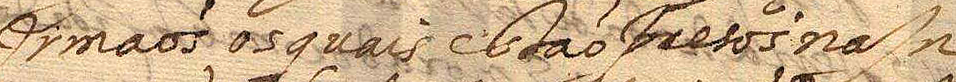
Jrmaõs os quais estaõ presos na Jn
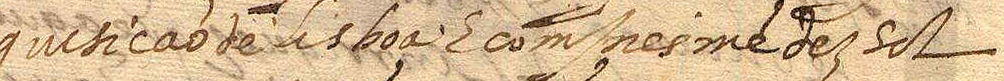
quisiçaõ de Lisboa E com Jnes mēdez soL
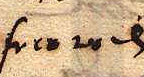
frco rois
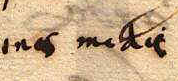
ines medes
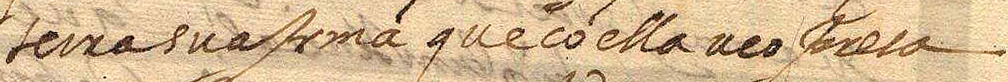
teira sua Jrmã que cō ella ueo presa
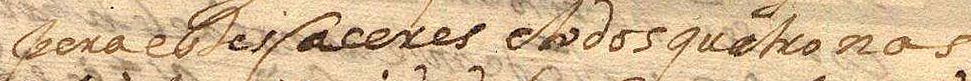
pera estes Caceres e todos quatro nas
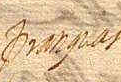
Pratiquas
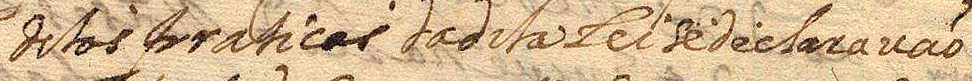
ditas praticas da dita Lei se declarauaõ
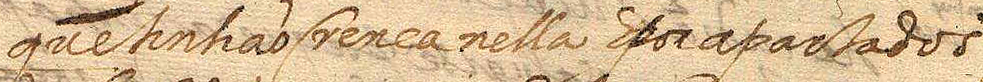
que tinhaõ Crença nella E por apartados
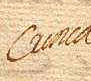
Crença
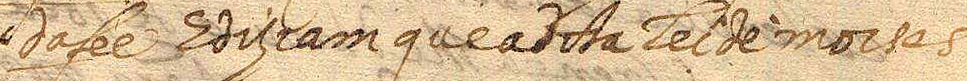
da fee E diziam que a dita Lei de moises
